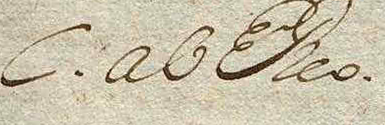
C. ao Reo.
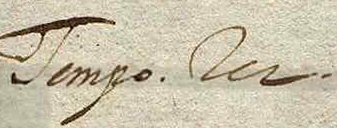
Tempo. Rez.
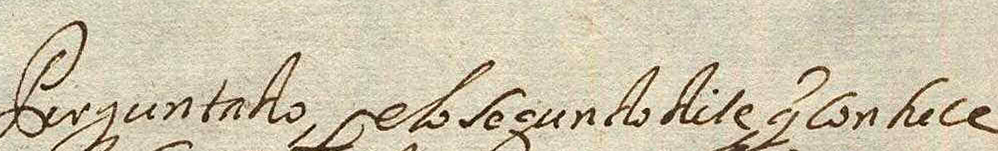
Perguntado, pelo segundo dise q̄ Conhece
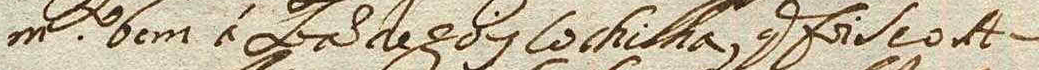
m.to bem á Joã de gois Cochilha, q̄ foi seo A
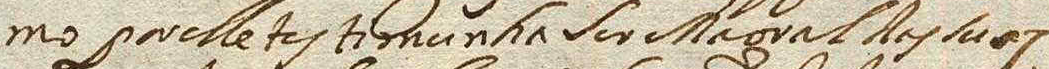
mo por elle testimunha ser Maoral das suas
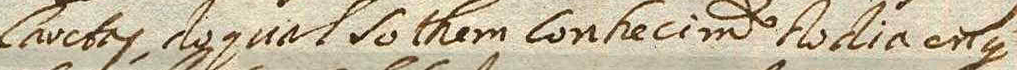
Caretas, do qual so them conhecimto do dia en q̄
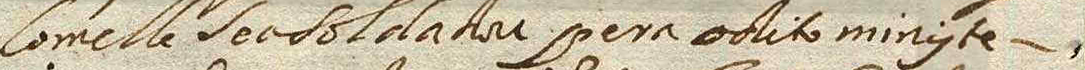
Com elle se asoldadou pera o dito ministe
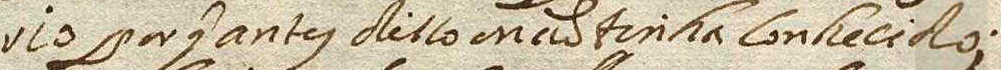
rio por q̄ antes disso naõ tinha Conhecido;
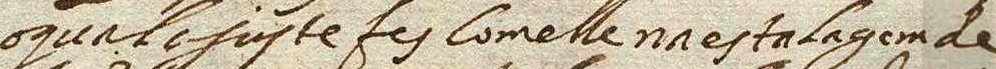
o qual ajuste fes Com elle na estalagem de
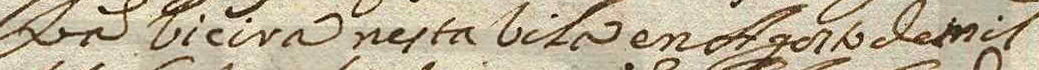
Joã Vieira nesta vila em Agosto de mil
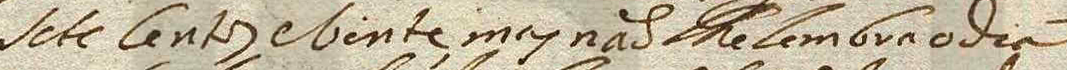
seteCentos e Vinte, mas não lhe lembra o dia
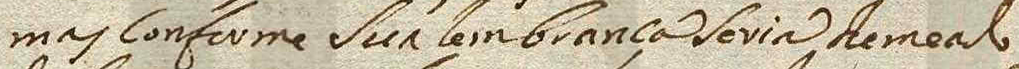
mas Conforme sua lembrança seria de meado
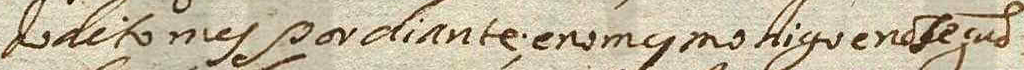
do dito mes por diante; e no mesmo digo e no segūe
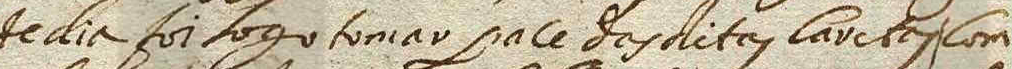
te dia foi logo tomar pace das ditas Caretas (Com
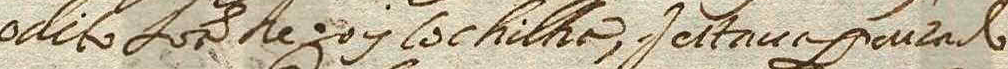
o dito Joã de gois Cochilha, q̄ estaua pouzado
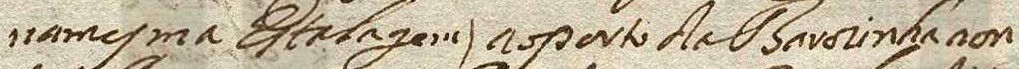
na mesma Estalagem) ao porto da Barozinha aon
